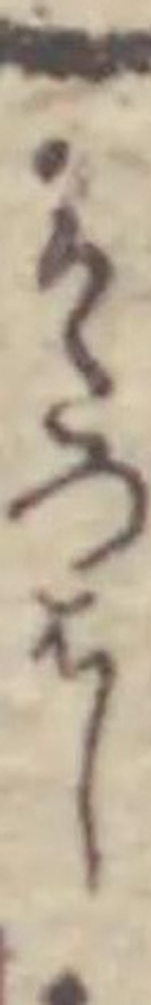かたつはし
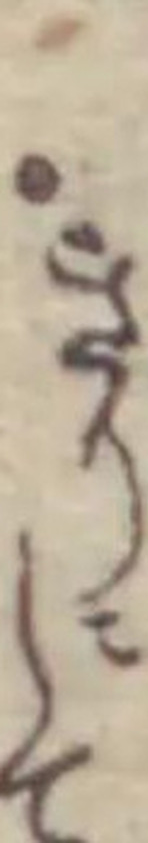きりにして
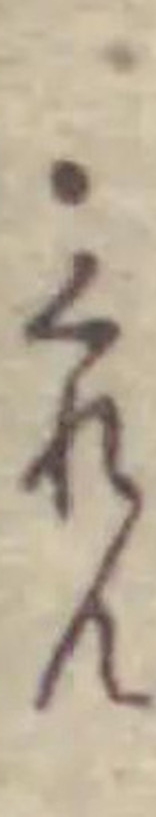くれん
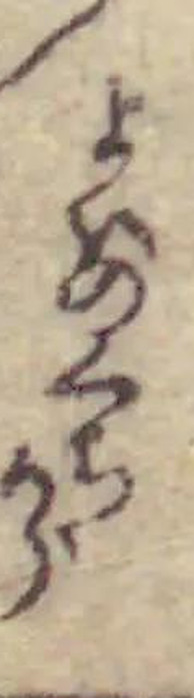よいのくちから

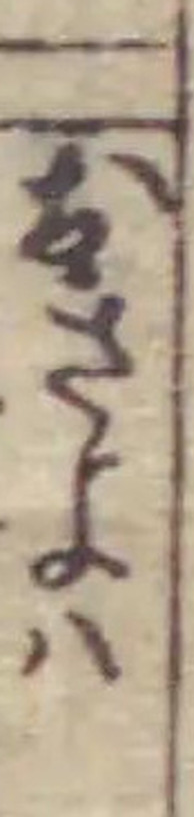おきよは
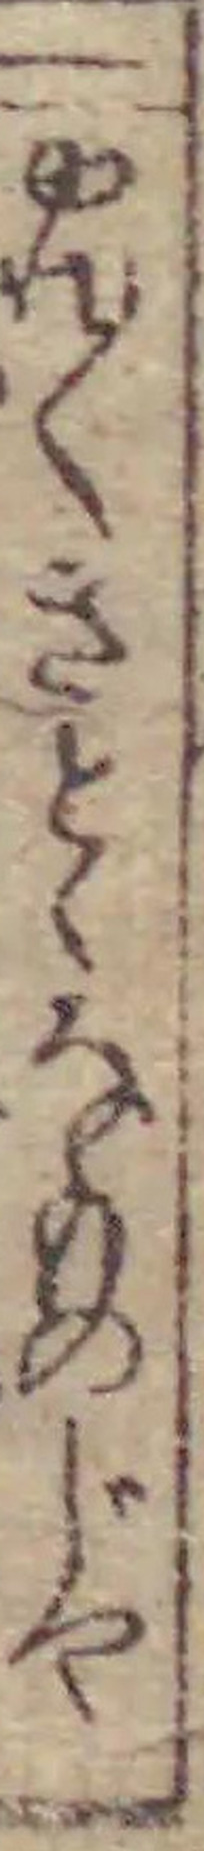やれ〳〵きとくなものじや
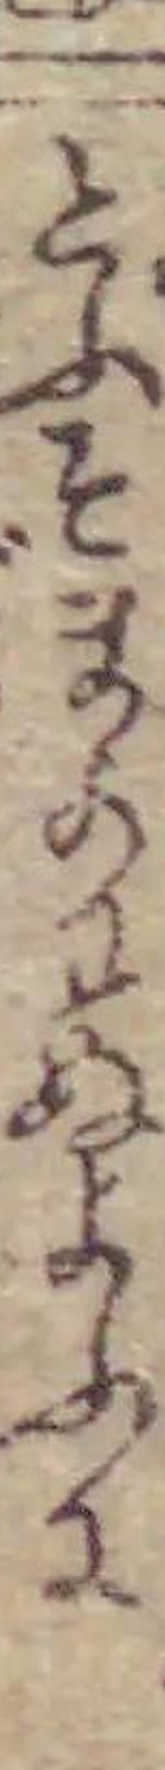とふそまよわぬよふに
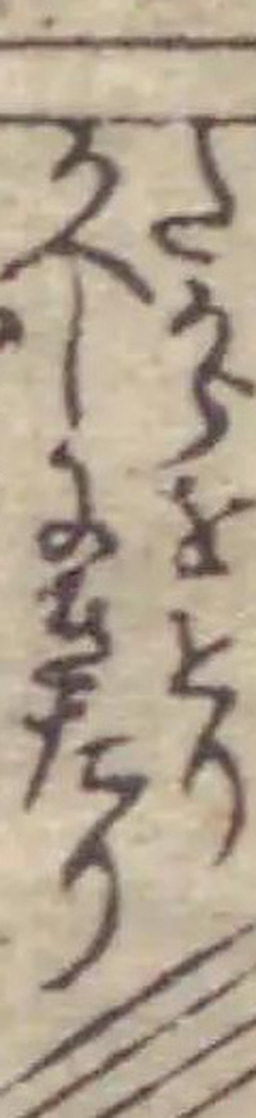かへしにきたり
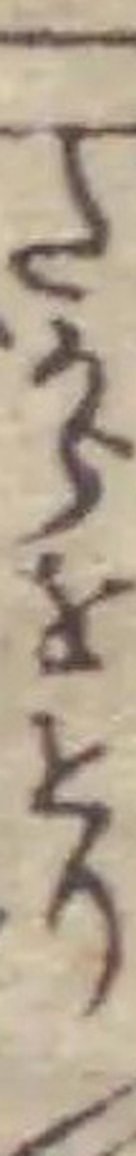たからをとり
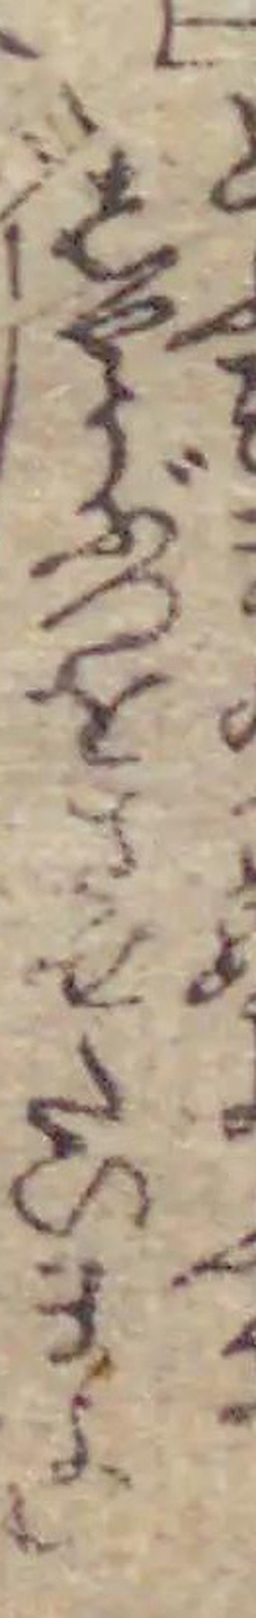しやうぶつをさせたいまよ
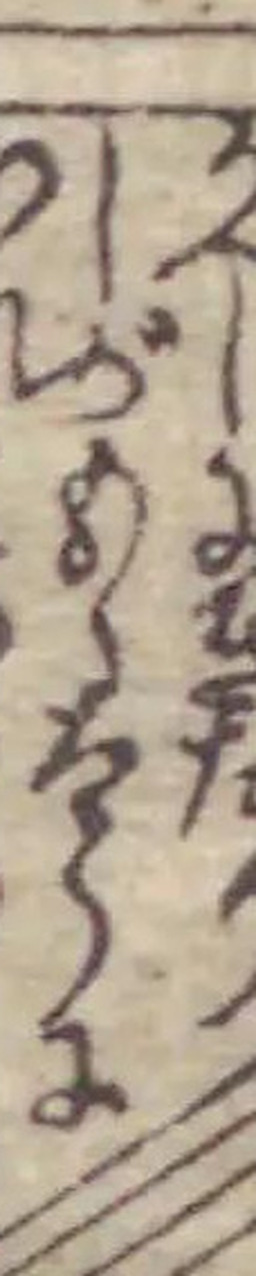しがもゝ太郎に
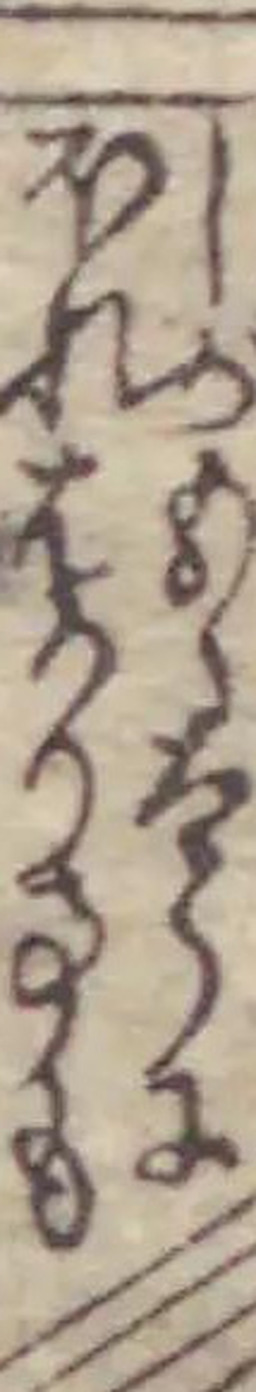ほれはかり事も
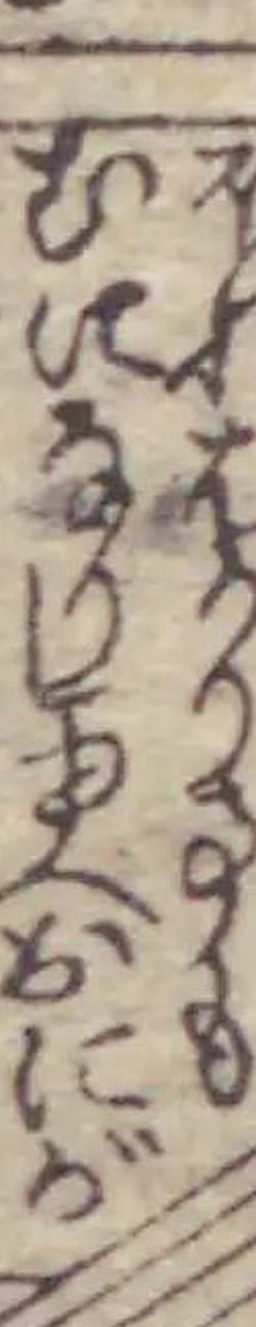むになりしゆへおにが
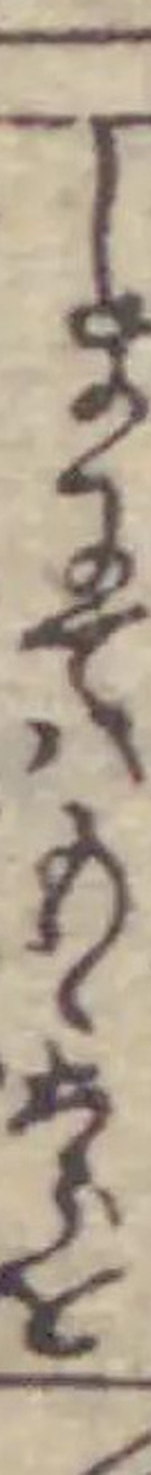しまにてはもゝ太郎を
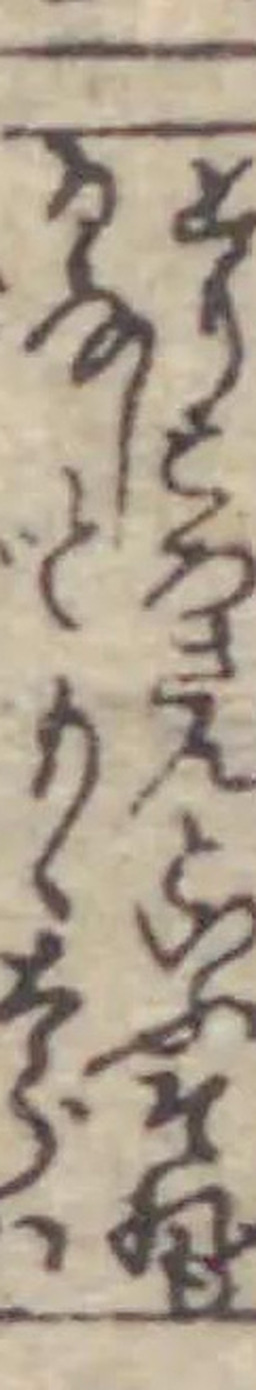かなしともゝ太郎は
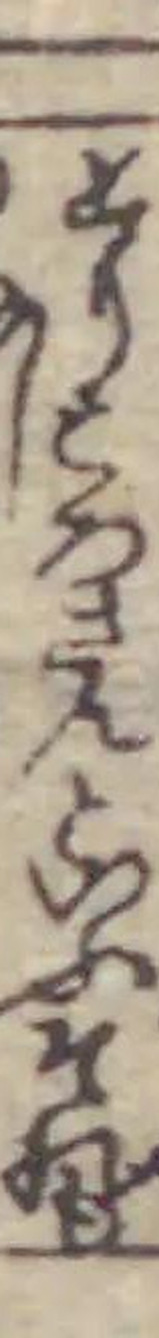とりころさんといふそれも
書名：桃太郎元服姿 2巻
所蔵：国立国会図書館 National Diet Library, JAPAN
